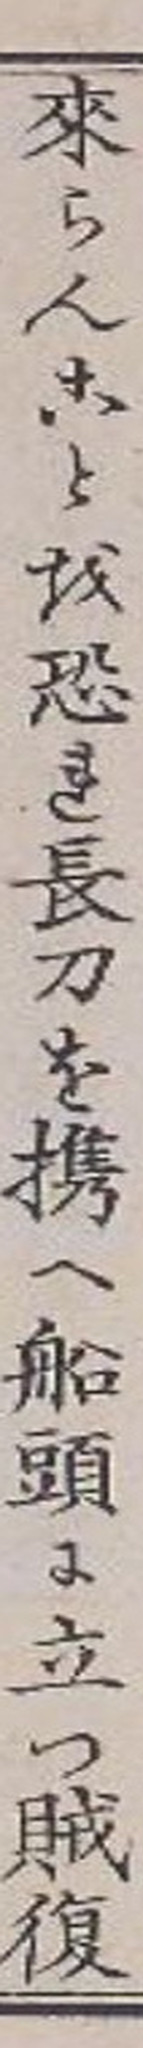来らんことを恐れ長刀を携へ船頭に立つ賊復
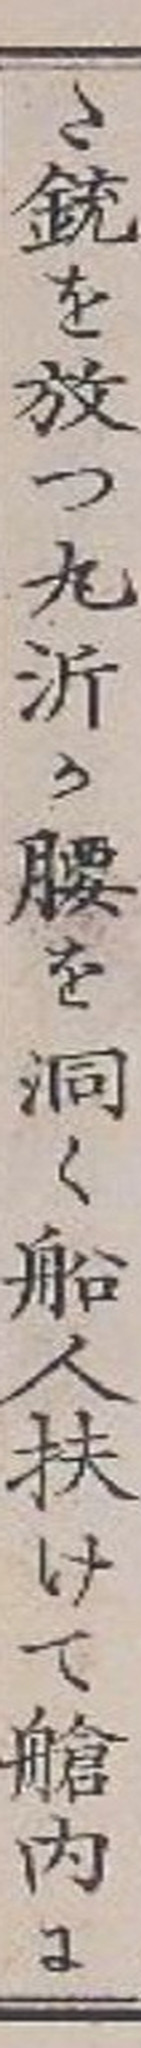た銃を放つ丸沂か腰を洞つ船人扶けて艙内に

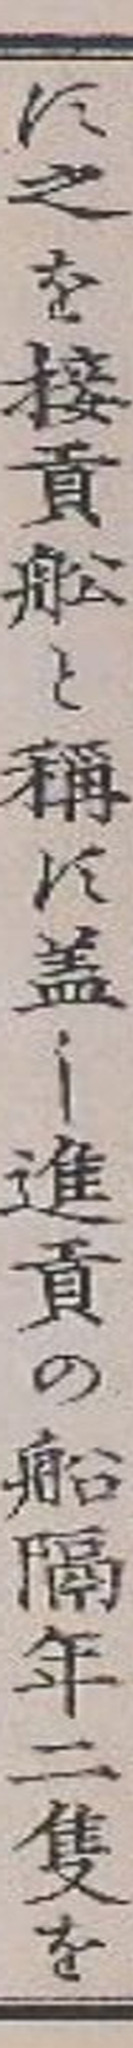す之を接貢船と称す盖し進貢の船隔年二隻を
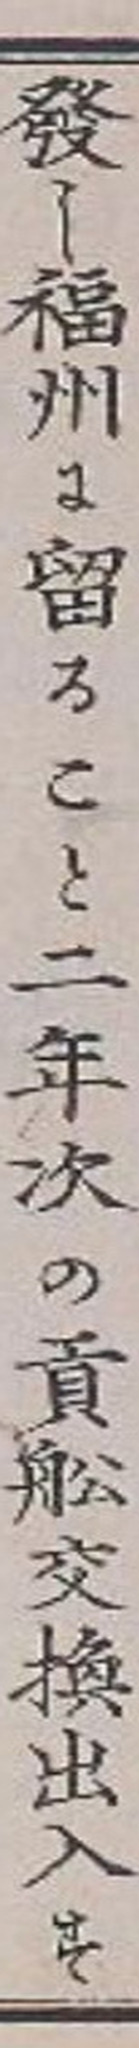発し福州に留ること二年次の貢船交換出入す
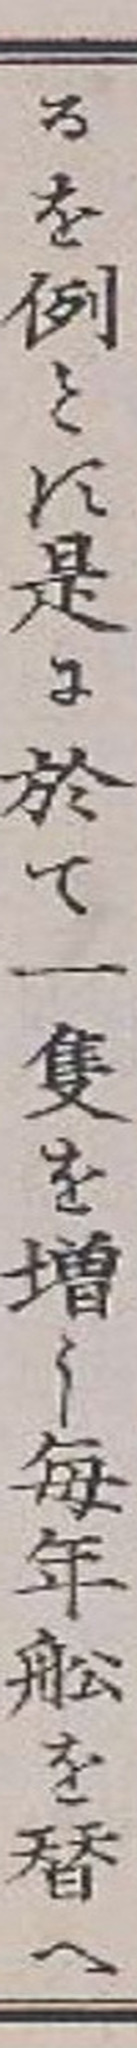るを例とす是に於て一隻を増し毎年船を替へ
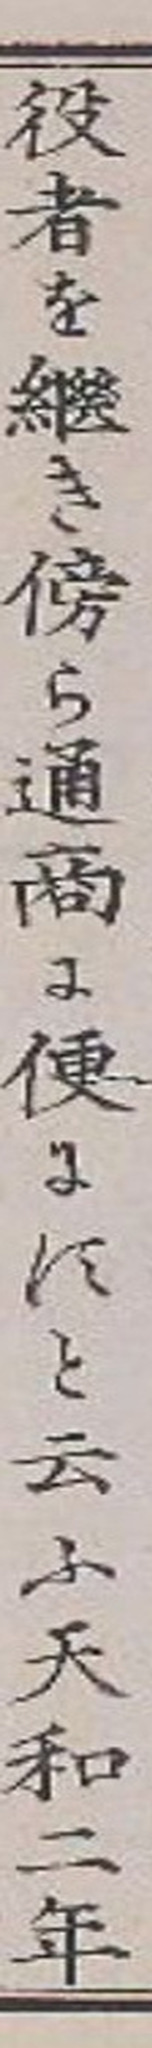役者を継き傍ら通商に便にすと云ふ天和二年
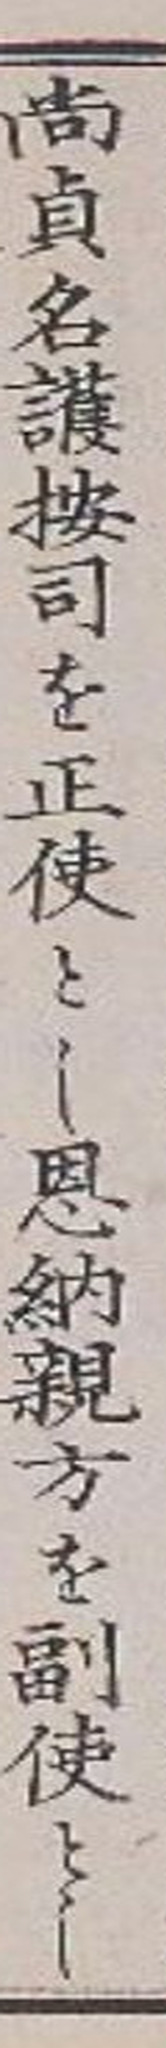尚貞名護按司を正使とし恩納親方を副使とし
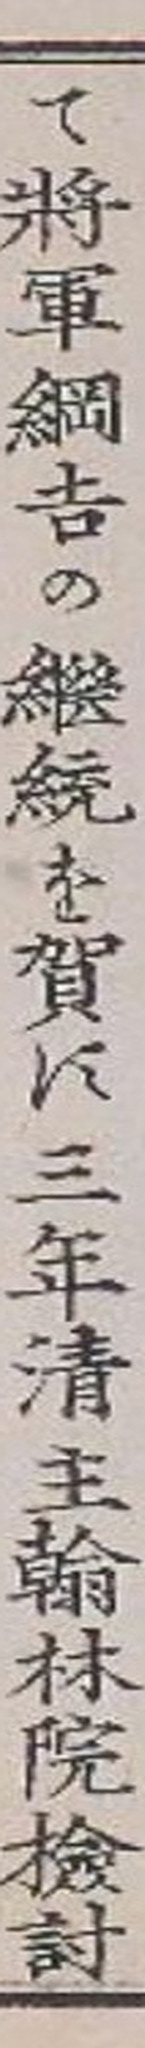て将軍綱吉の継統を賀す三年清主翰林院検討
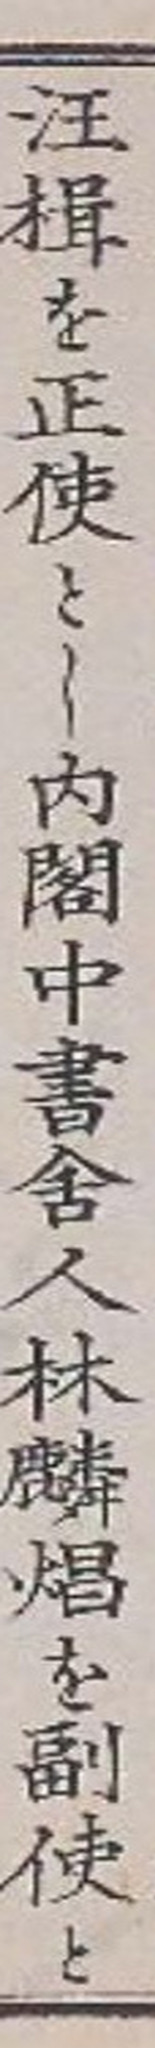汪楫を正使とし内閣中書舎人林麟焻を副使と
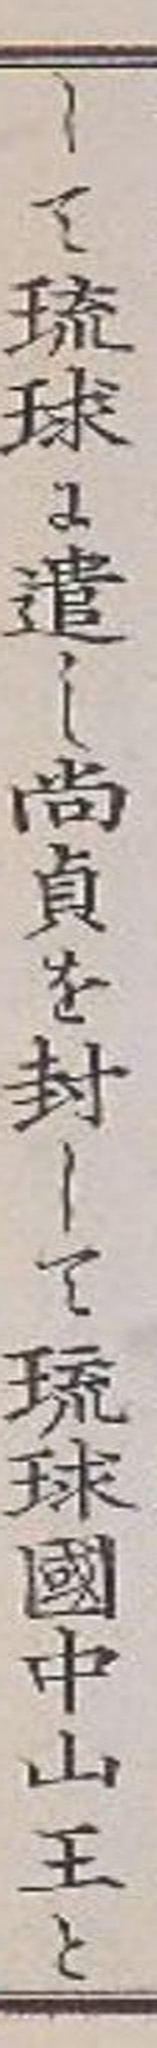して琉球に遣し尚貞を封して琉球国中山王と
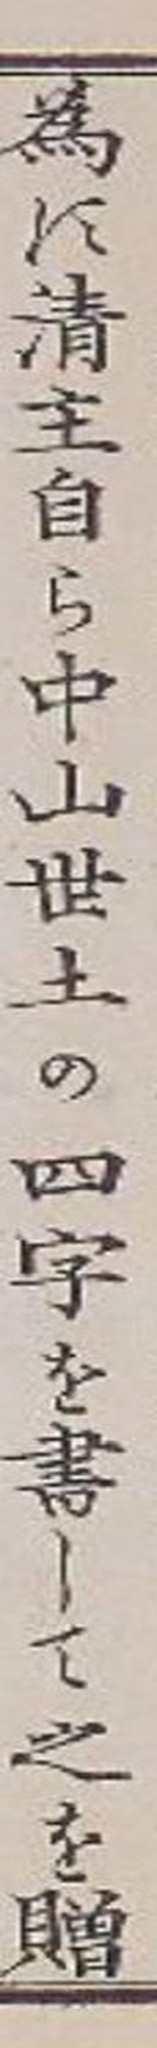為す清主自ら中山世土の四字を書して之を贈
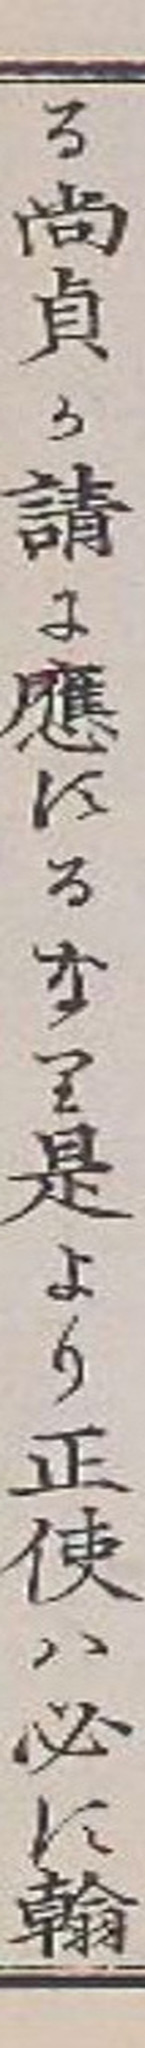る尚貞か請に応するなり是より正使は必す翰
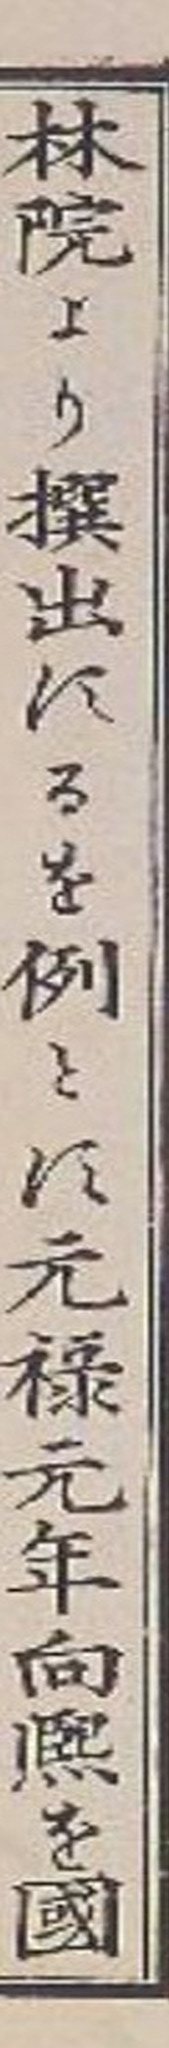林院より選出するを例とす元禄元年向煕を国
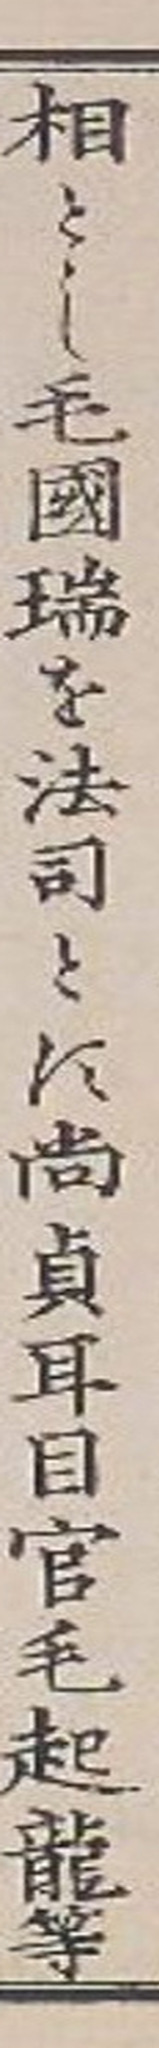相とし毛国瑞を法司とす尚貞耳目官毛起龍等
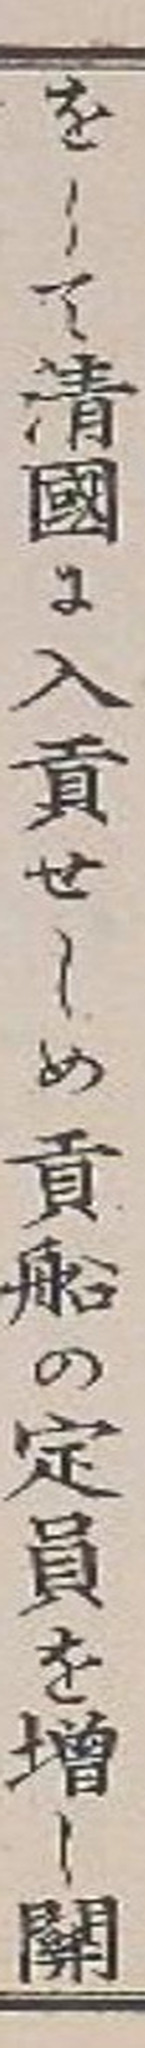をして清国に入貢せしめ貢船の定員を増し関
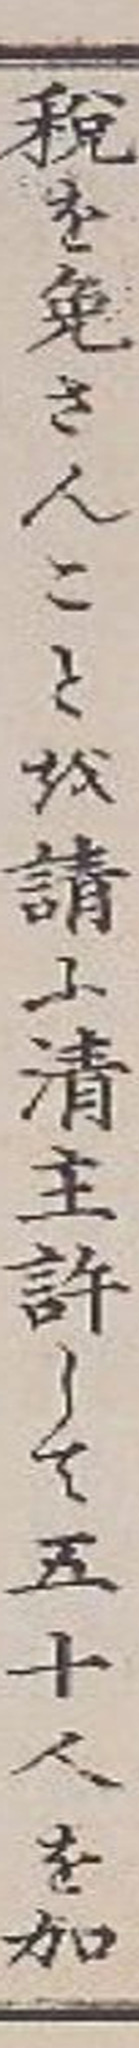税を免さんことを請ふ清主許して五十人を加
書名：南島紀事 下
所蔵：University of the Ryukyus Library
